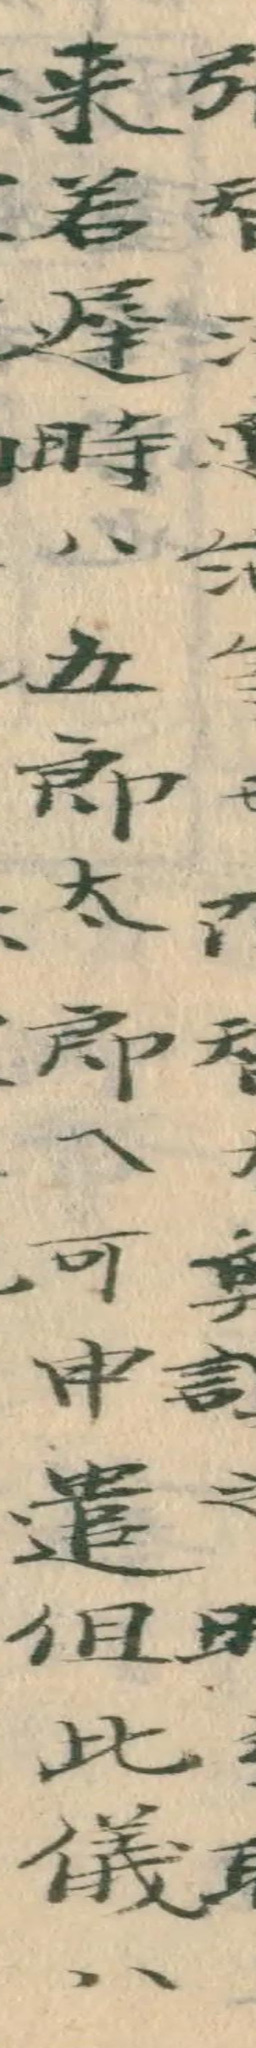来若遅時ハ五郎太郎へ可申遣但此儀ハ
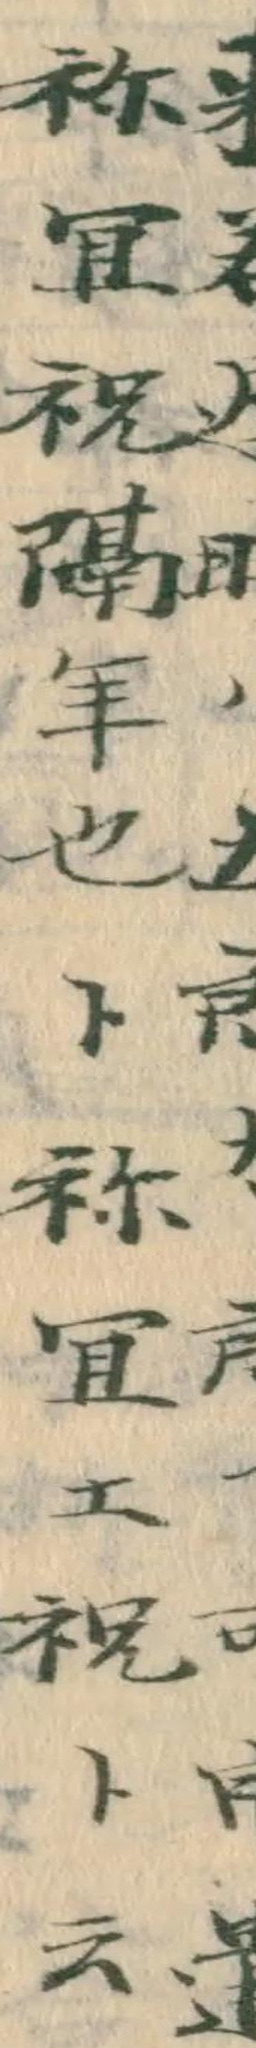禰宜祝隔年也と禰宜エ祝ト云
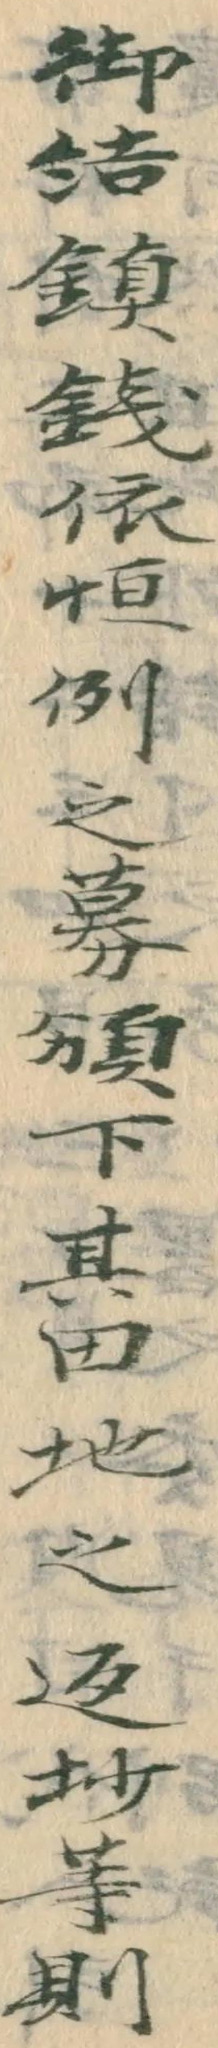御結鎮銭依恒例之募領下其田地之返抄等則
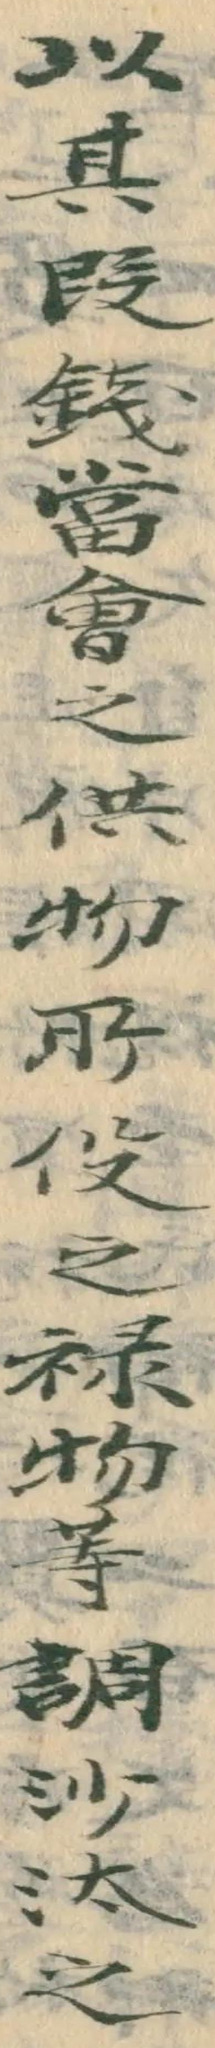以其段銭当会之供物所役之禄物等調沙汰之
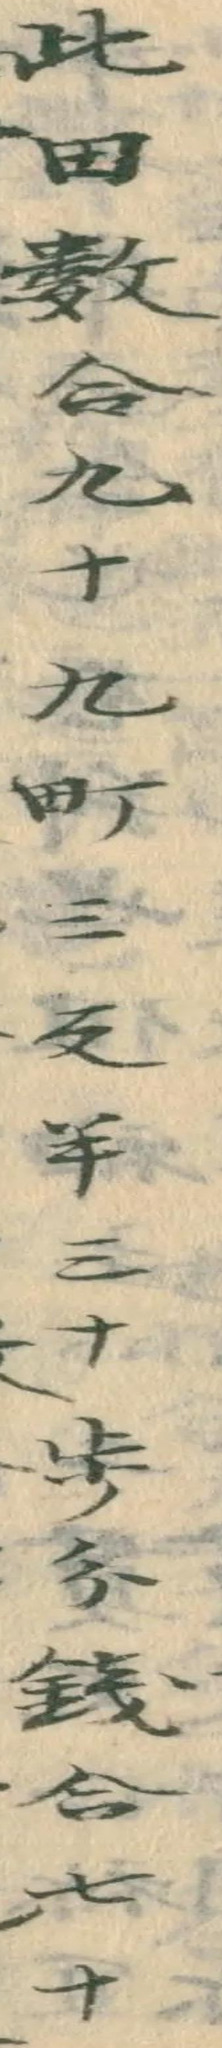此田数合九十九町三反半三十歩分銭合七十
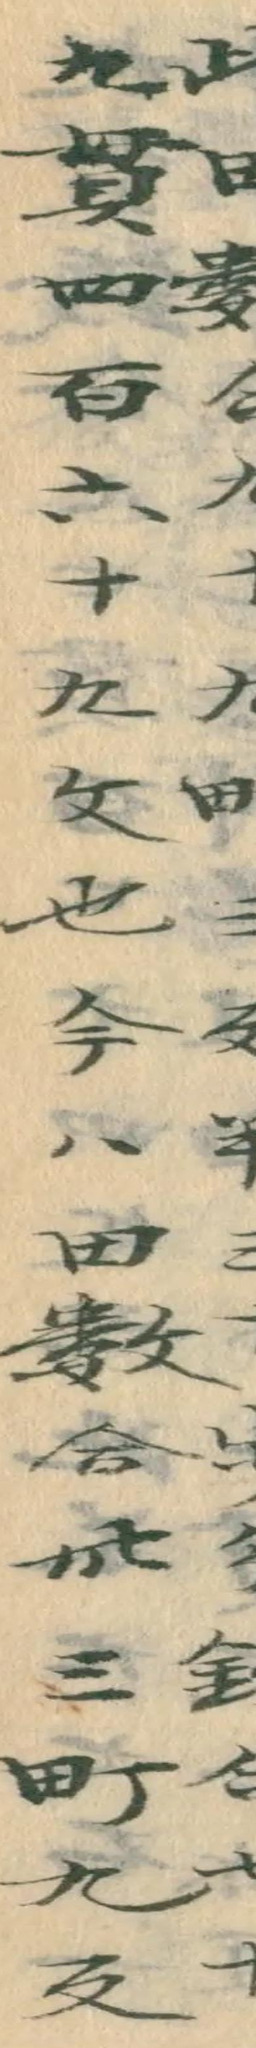九貫四百六十九文也今ハ田数合卅三町九反

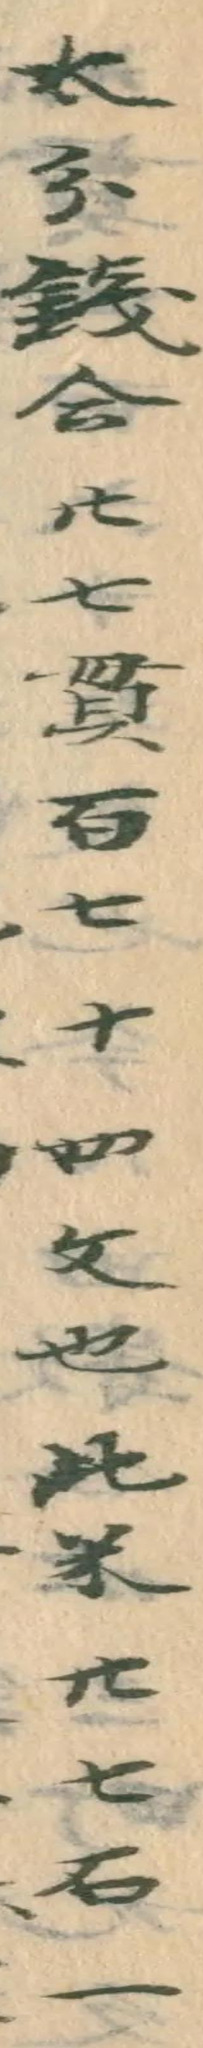太分銭合廿七貫百七十四文也此米廿七石一
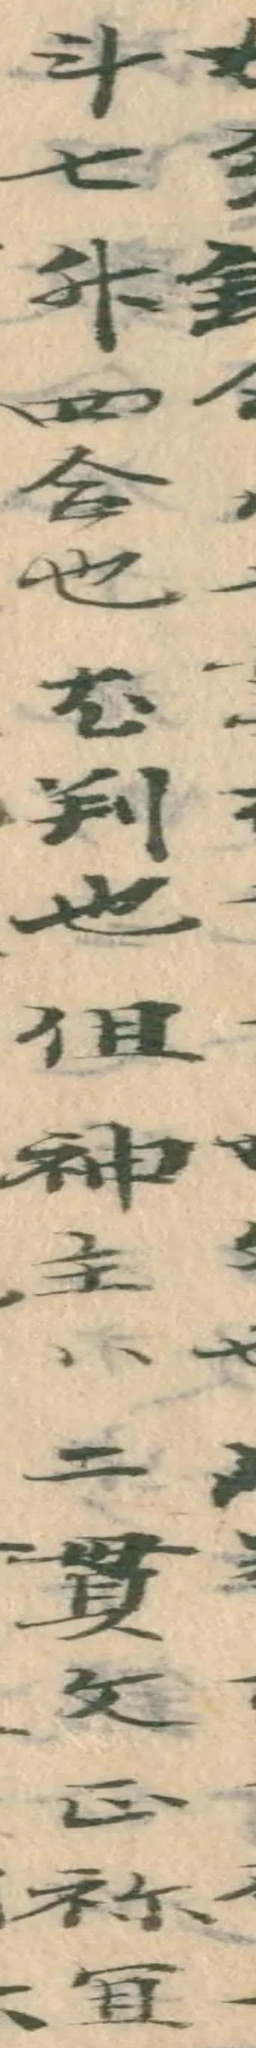斗七升四合也尤判也但神主ハ二貫文正禰宜
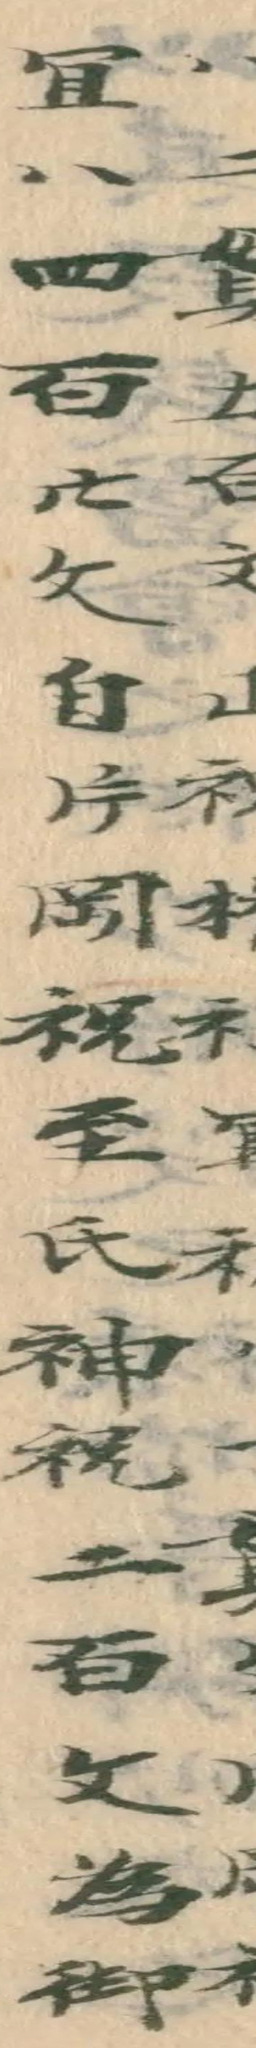宜ハ四百廿文自片岡祝至氏神祝二百文為御
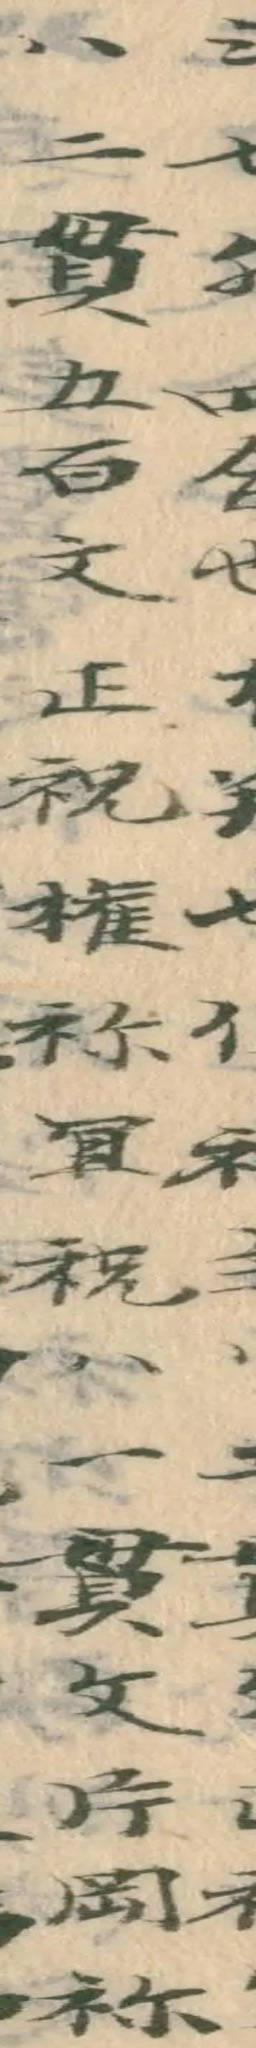ハ二貫五百文正祝権禰宜祝ハ一貫文片岡禰
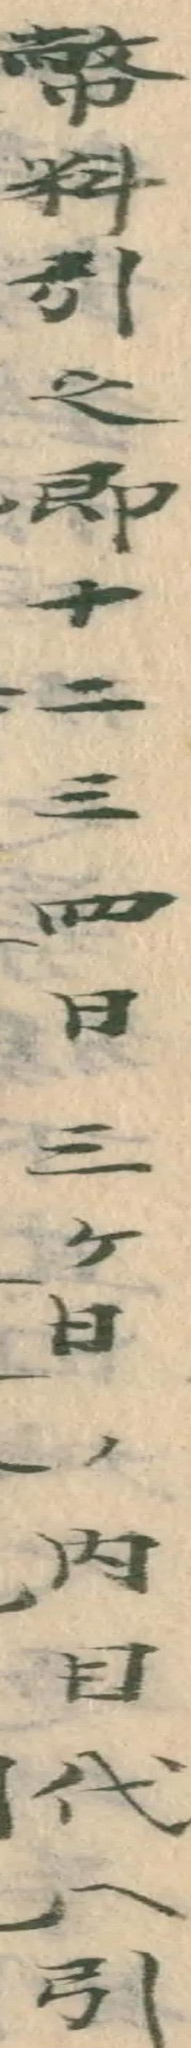弊料引之即十二三四日三ヶ日ノ内目代ヘ引
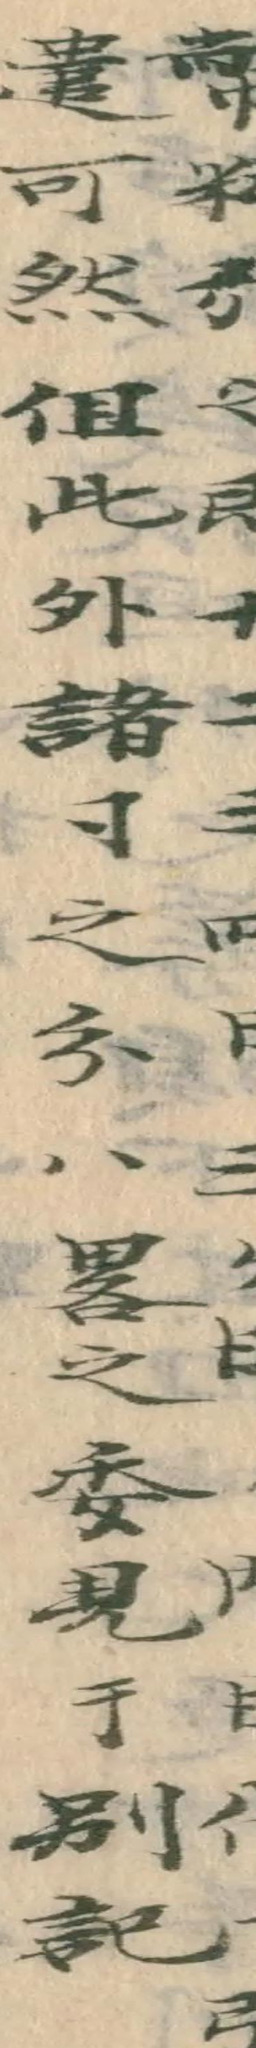遣可然但此外諸司之分ハ略之委見于別記
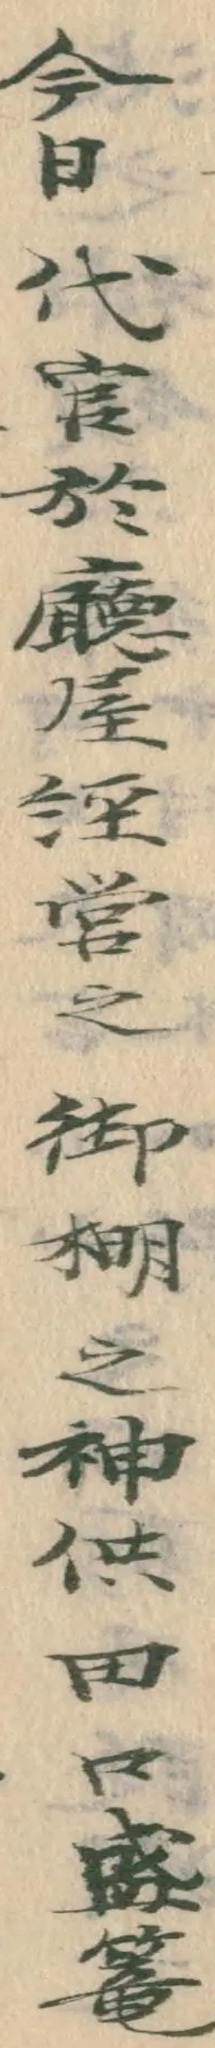今日代官於庁屋経営之御棚之神供田口盛篭
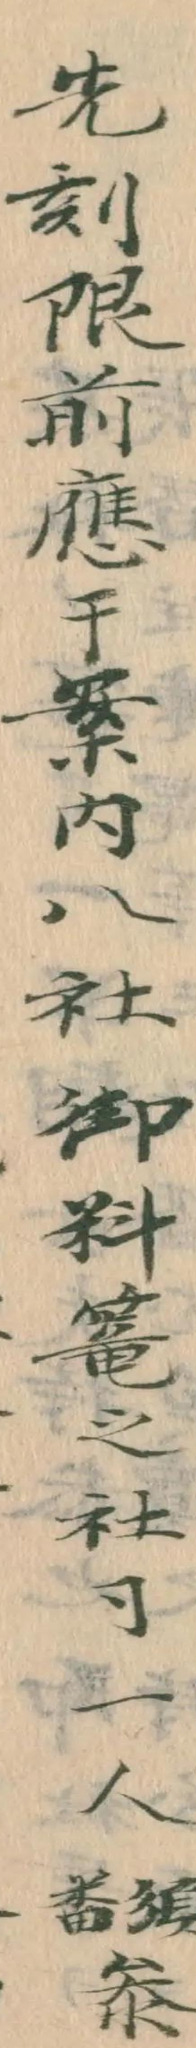先刻限前応于案内八社御料篭之社司一人須番参
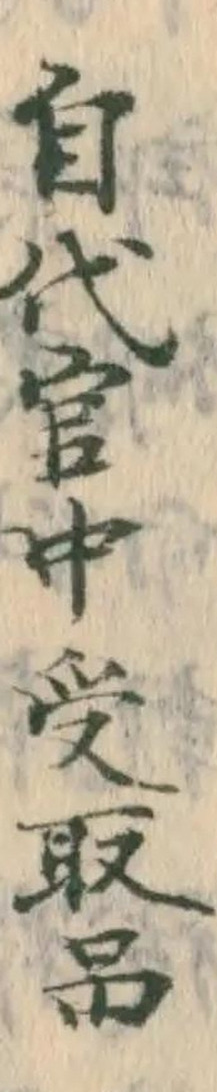自代官中受取品
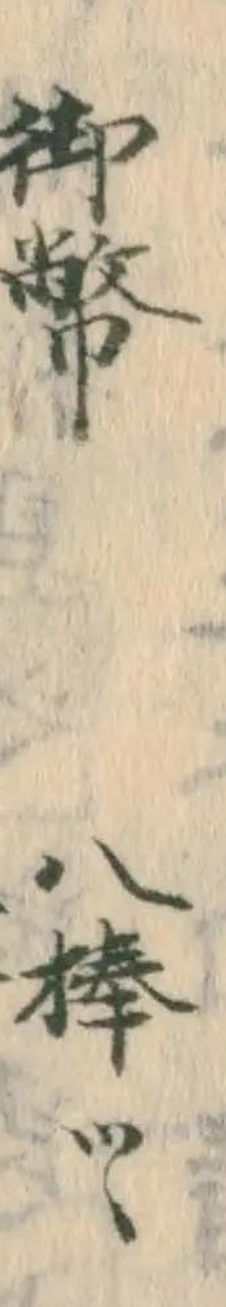御幣八棒ツヽ
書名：賀茂社記録. 第5冊
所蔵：国立国会図書館 National Diet Library, JAPAN
